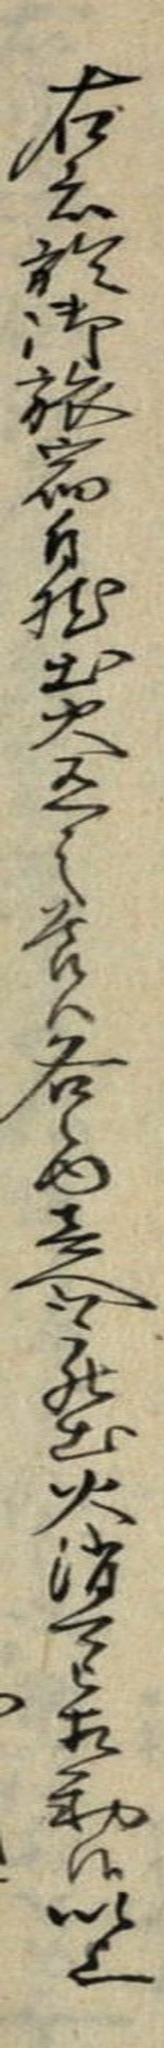右は於御旅宿自然出火有之節は各之内壱人つゝ罷出火消可被相勤候以上
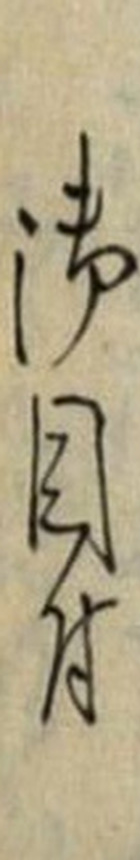御目付
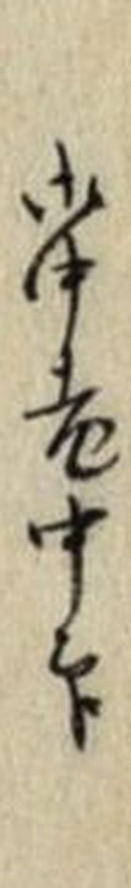御中老中印
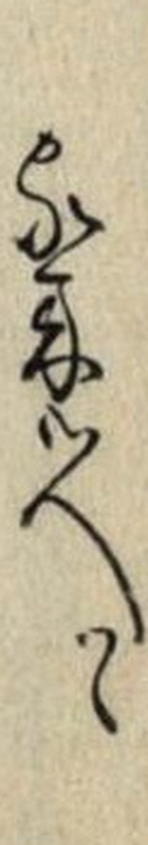家来弐人ツヽ
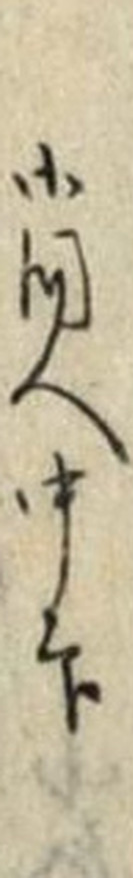御用人中印
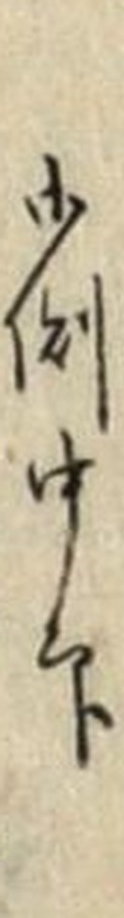御側中印
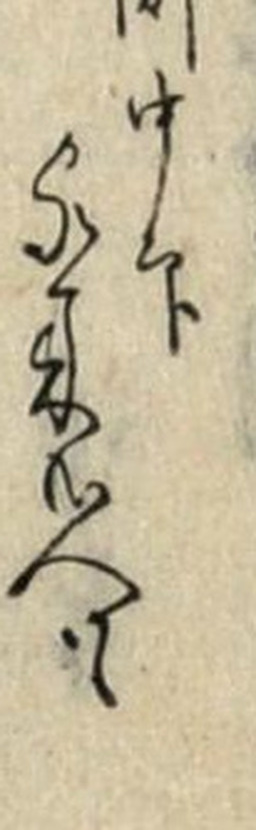家来弐人ツヽ
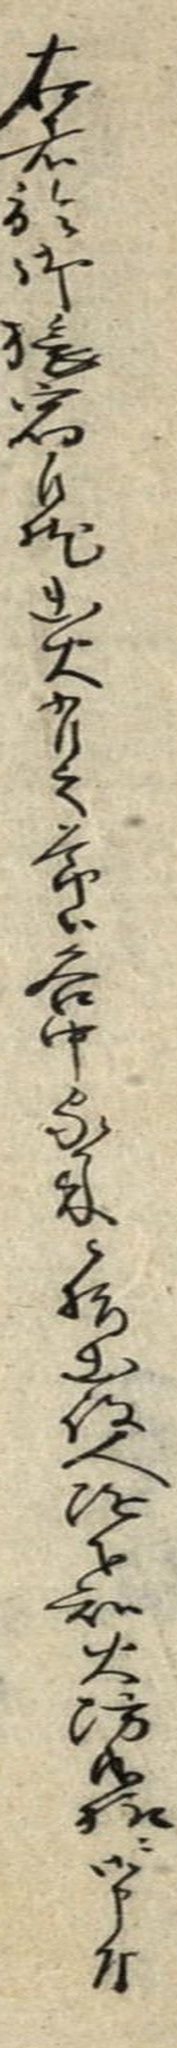右は於御旅宿自然出火有之節は各中家来被指出役人随下知火防候様に御申付
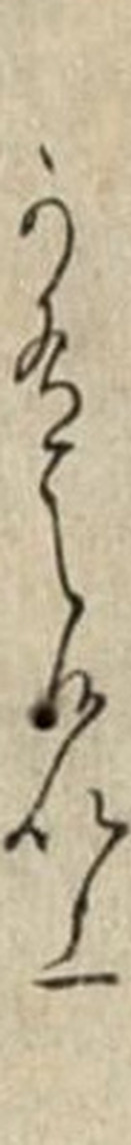可有之候以上
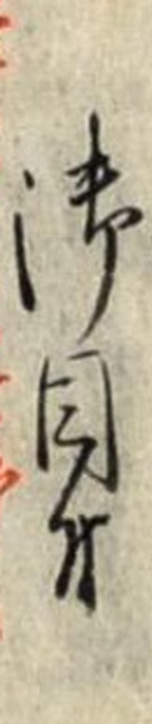御目付

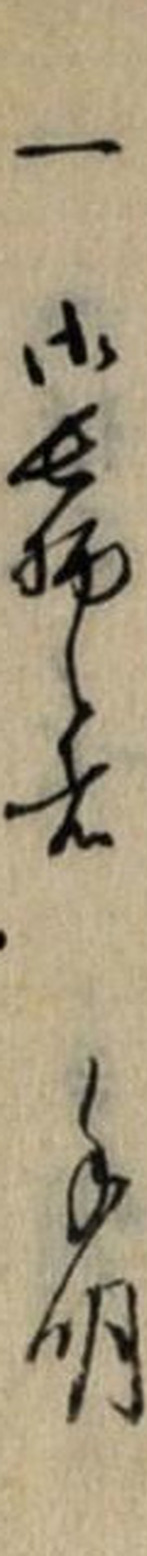一御長柄之者小頭印
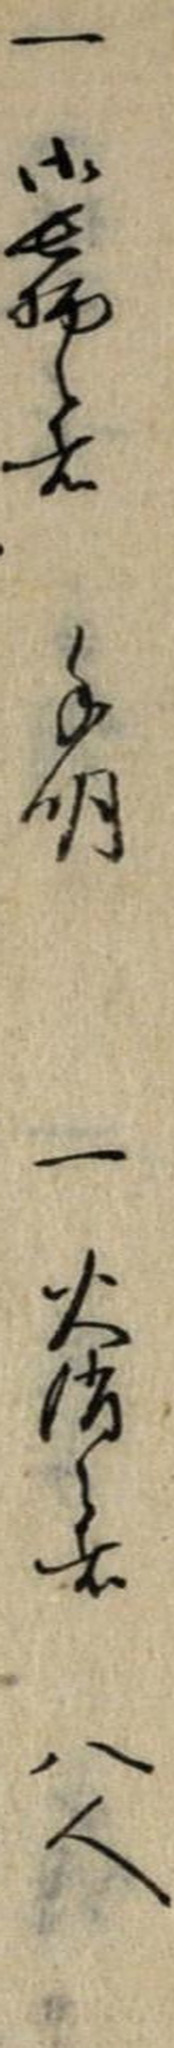一御長柄之者手明一火消之者八人
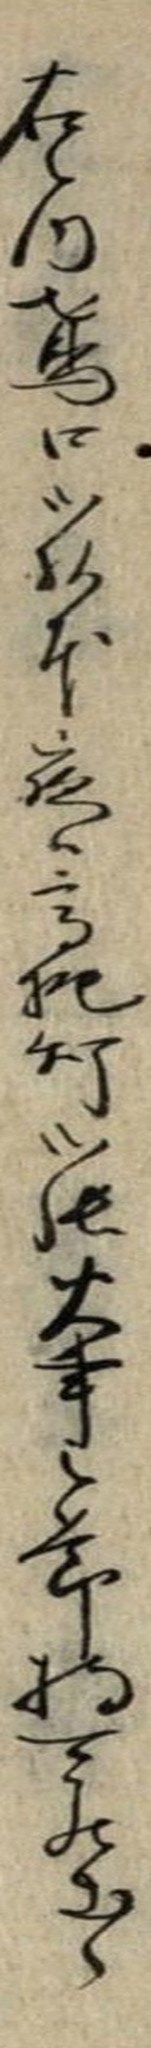右之内鳶口弐拾本夜は高挑灯弐張火事之節持可罷出候
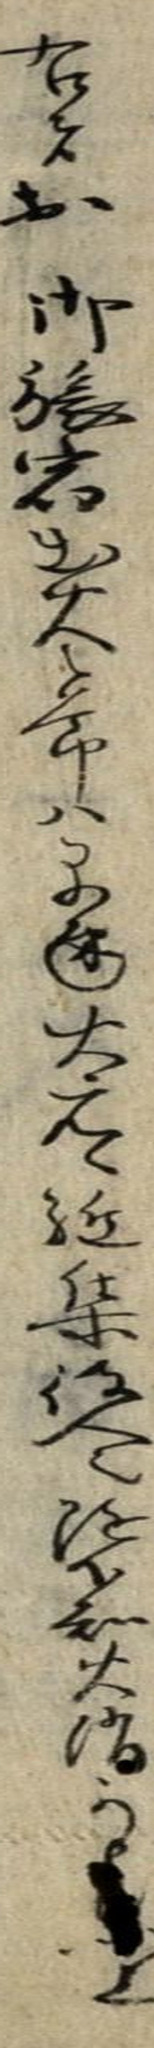右は於御旅宿出火之節は早速火元へ駆集役人之随下知火消可申候以上
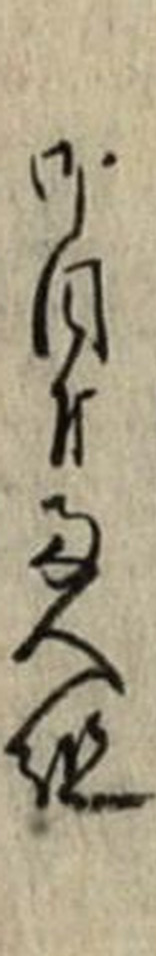御目付両人組
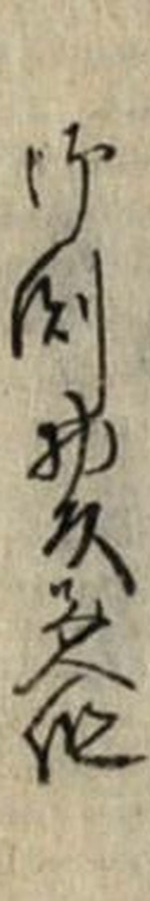御側物頭両人組
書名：三都并道中之部
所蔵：福井県文書館 Fukui Prefectural Archives
